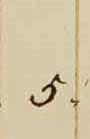5
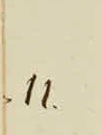11.
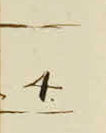4.
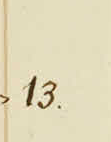13.
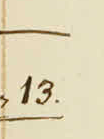13.
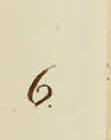6.
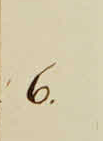6.
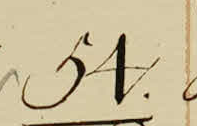54.
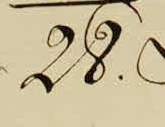28.
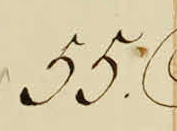55.
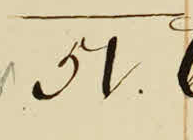51.
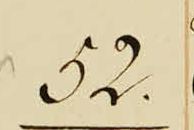52.
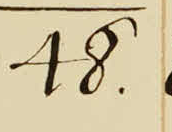48.
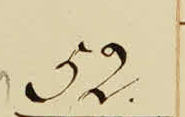52.
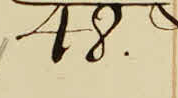48.
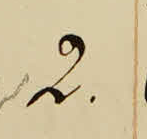2.
